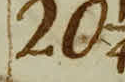20
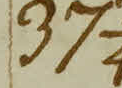37
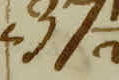37
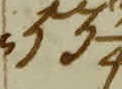53
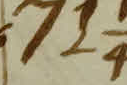71
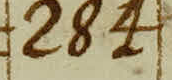284
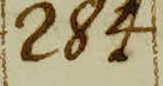284
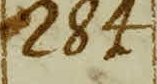284
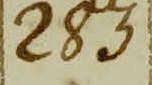283
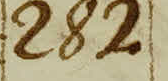282
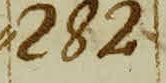282
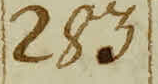283
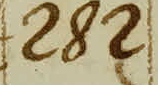282
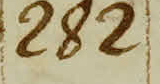282
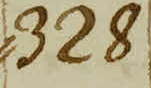328
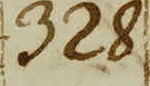328
